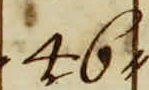46
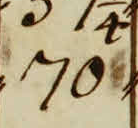70
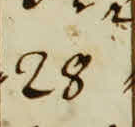28
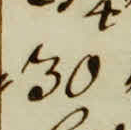30
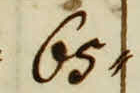65
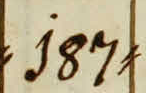187
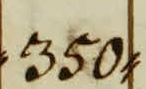350
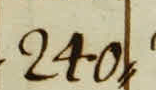240
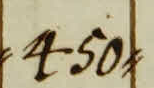450
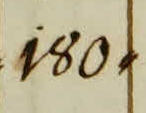180
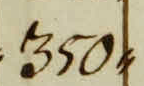350
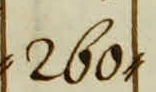260
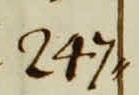247
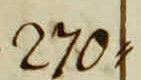270
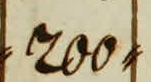200
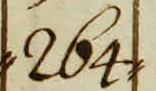264
